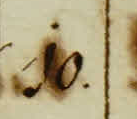10.
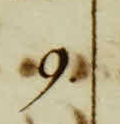9.
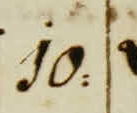10:
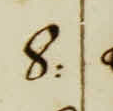8:
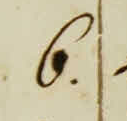6.
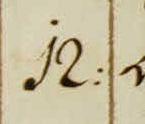12:
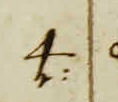4:
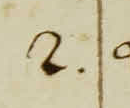2.
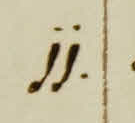11.
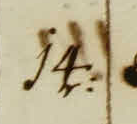14:
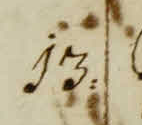13:
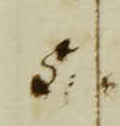5:
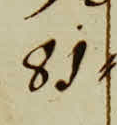81
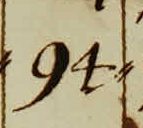94
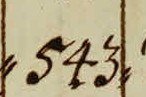543
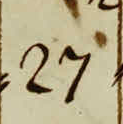27
